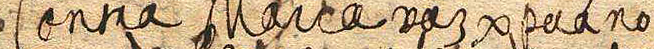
Contra Maria vaz xpaā no
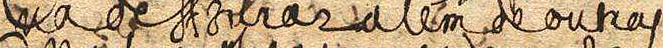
ua de Azurar alem de outras
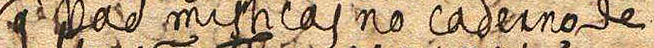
q̄ vaõ misticas no caderno de
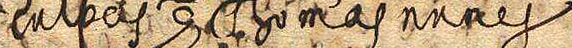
culpas ꝯ̄ Thomas nunes
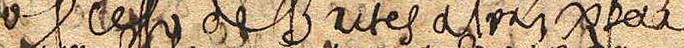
Do ꝓcesso de Brites alvz̄ xpaā
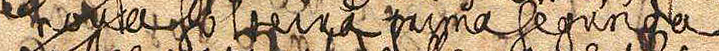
noua solteira prima segunda
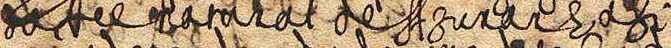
da Ree natural de Azurar E ahi
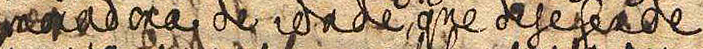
moradora de idade, que dise ser de
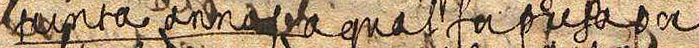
trinta annos a qual foi presa por
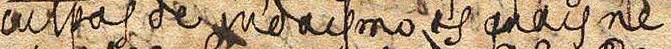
culpas de iudaismo as quais ne
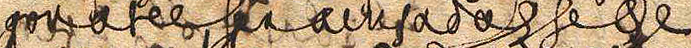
gou atee ser acusada E se lhe
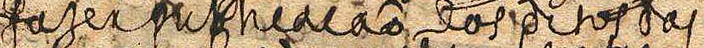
fazer publicacaõ dos ditos das
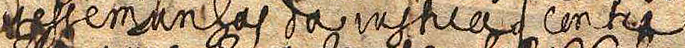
testemunhas da iustica q̄ contra
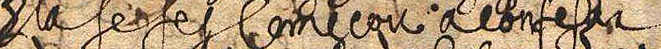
Ela se fes Comecou a confesar
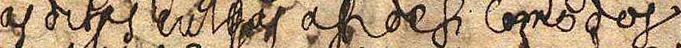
as ditas culpas assi de si como dos
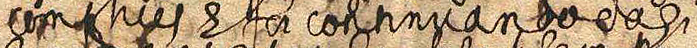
complices E foi continuando dahi
